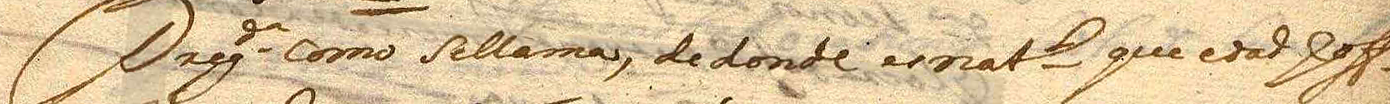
Preg.da como se llama, de donde es nat.l que edad y offo
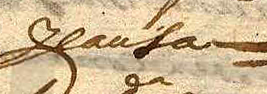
y causa
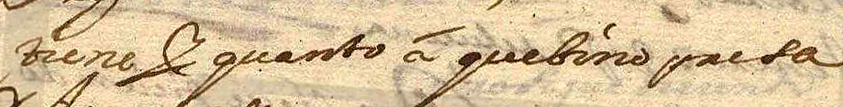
tiene y quanto á que bino presa
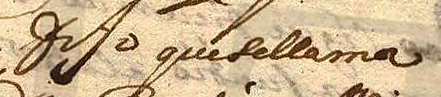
DiJo que se llama
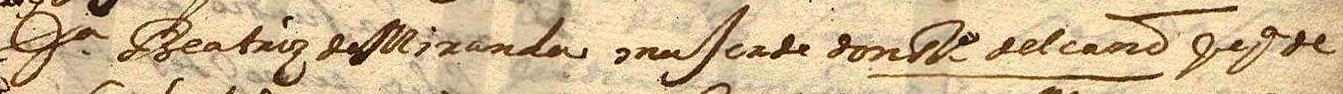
D.a Beatriz de Miranda muJer de don R.o del can̄o veja de
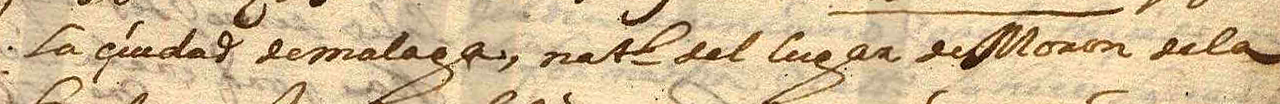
la ciudad de malaga, nat.l del lugar de Moron de la
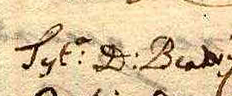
Testa: D. Beatris
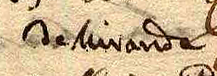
de Miranda
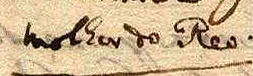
molher do Reo.
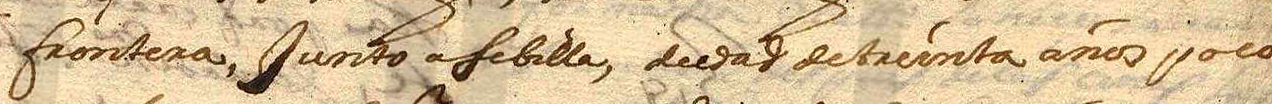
frontera, Junto a sebilla, de edad de treinta an̄os poco
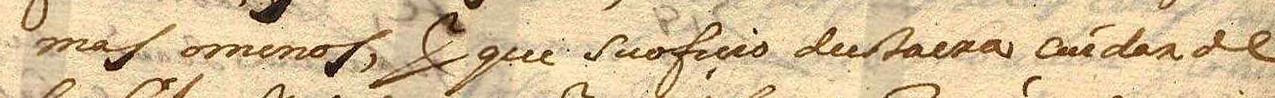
mas o menos, y que su oficio de esta era cuidar de
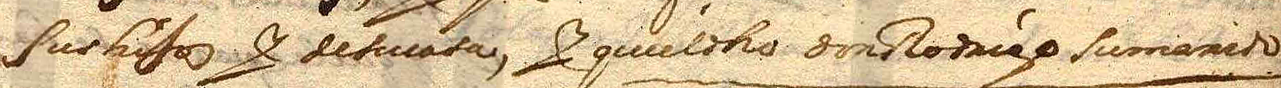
sus hiJos y de su casa, y que el dho don Rodrigo su marido
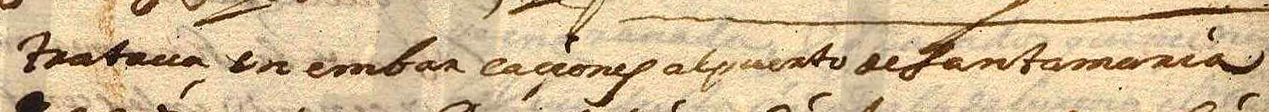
trataua en embarcaciones al puerto de santa maria
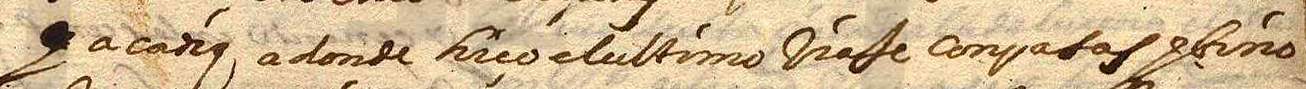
a cadiz, adonde hiço el ultimo viaJe con pasas y bino
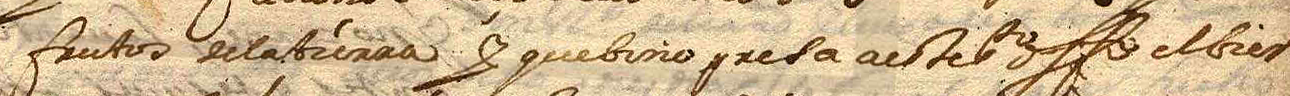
frutos de la tierra y que bino presa a este sto offo el bier
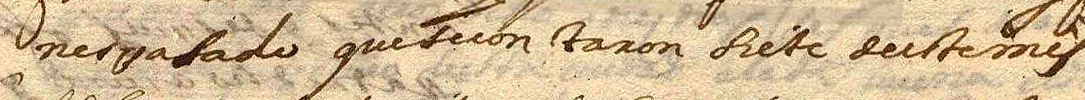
nes pasado que se contaron siete deste mes
